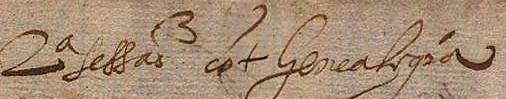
2a sessaõ cō + Genealogia
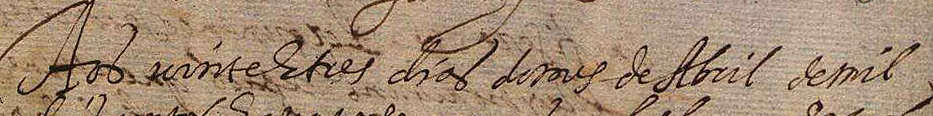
Aos uinte E tres dias do mes de Abril de mil
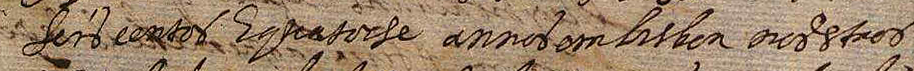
seiscentos E quatorse annos em lisboa nos estaos
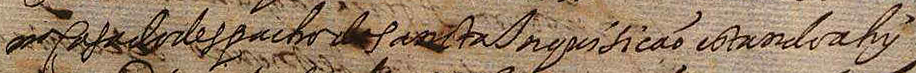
na Casa do despacho da sancta Inquisiçaõ estando ahy
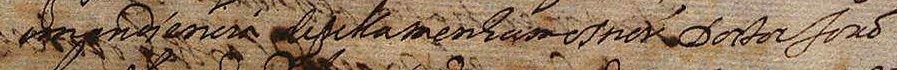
em audiencia de pella menham o snor̄ Doctor Joaõ
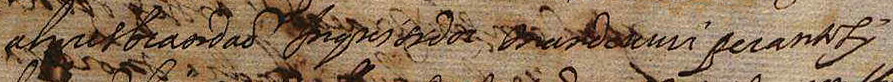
alures brandaõ Jnquisidor mandou uir perante sy
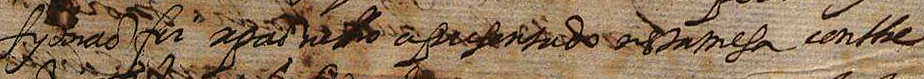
Symaõ frz̄ xpaõ uelho apresentado nesta mesa conthe
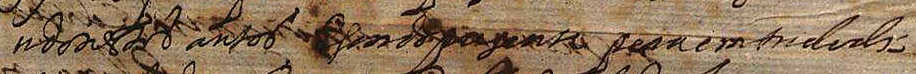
udo nestes autos e sendo presente pera em tudo di
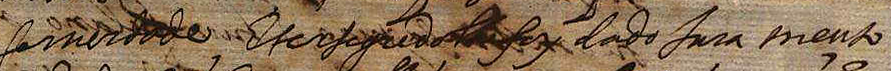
ser uerdade E ter segredo lhe foy dado Juramento
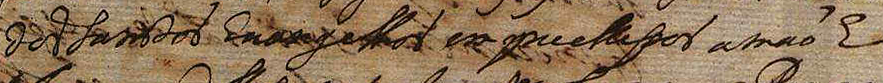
dos sanctos Euangelhos em que elle pos a maõ E
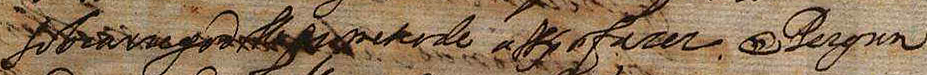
sob carrego delle prometeo de assy o fazer ⁋ Pergun
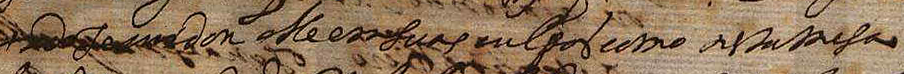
tado se cuidou elle em suas culpas como nesta mesa
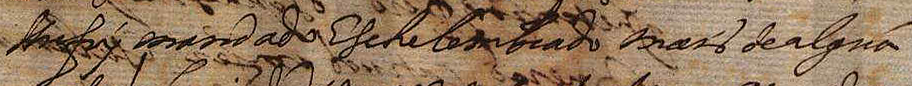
lhe foy mandado E se he lembrado mais de alguā
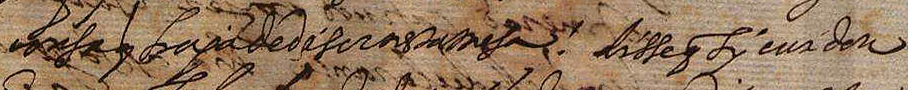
cousa q̄ haja de diser nesta mesa? disse q̄ sy cuidou
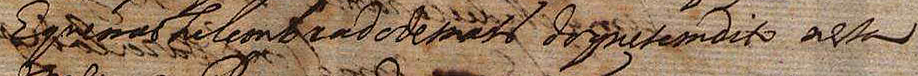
E que naõ he lembrado de mais do que tem dito nesta
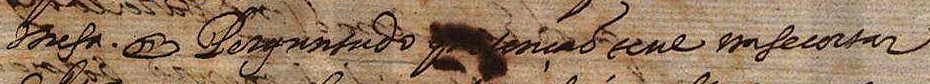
mesa. ⁋ Perguntado que tençaõ teue em se cortar
